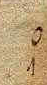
1o
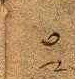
2o
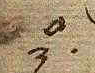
3o.
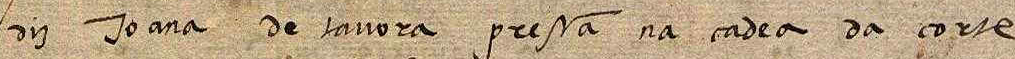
diz Joana de tauora pressa na cadea da corte
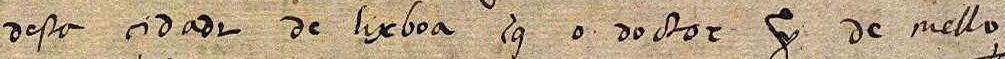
desta cidade de lixboa q̄ o doctor yo de mello
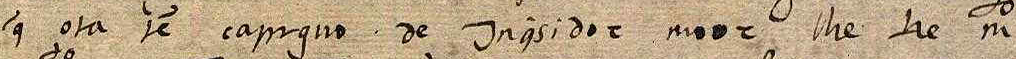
q̄ ora tē carreguo de Jnq̄sidor moor lhe he mto
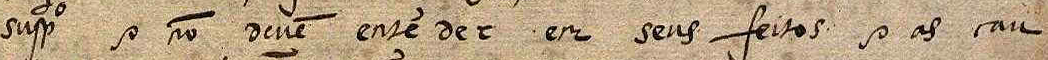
suspto e nō deue entēder em seus feitos e as cau
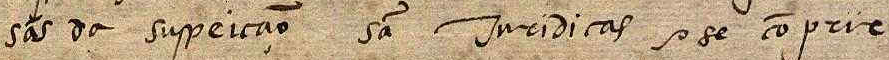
sas da suspeição sā Juridicas e se cōprir
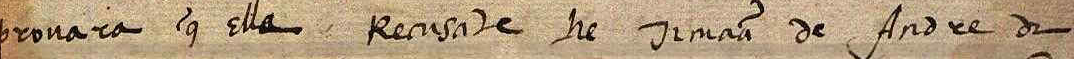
prouara q̄ Ella Recusāte he Jrmaā de Andre de
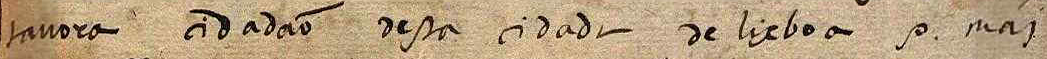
tauora cidadão desta cidade de lixboa e maȷ̃
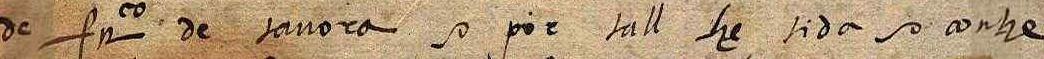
de frrco de tauora e por tall he tida e conhe
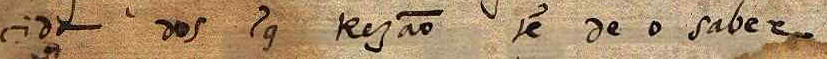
cida dos q̄ Rezão tē de o saber
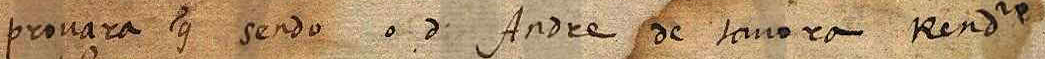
prouara q̄ sendo o d. Andre de tauora Rendro
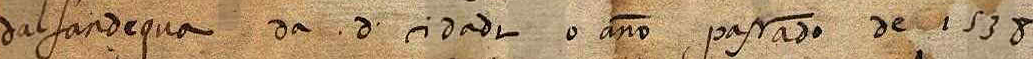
dalfandegua da d. cidade o an̄o passado de 1538
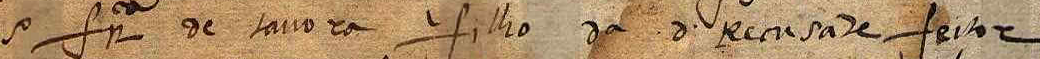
e frrco de tauora filho da d. Recusāte feitor
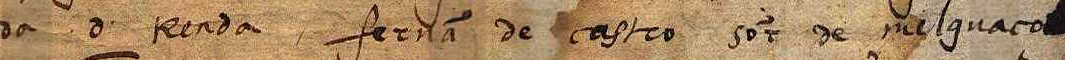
da d. Renda / fernā de castro sor̄ de melguaço
